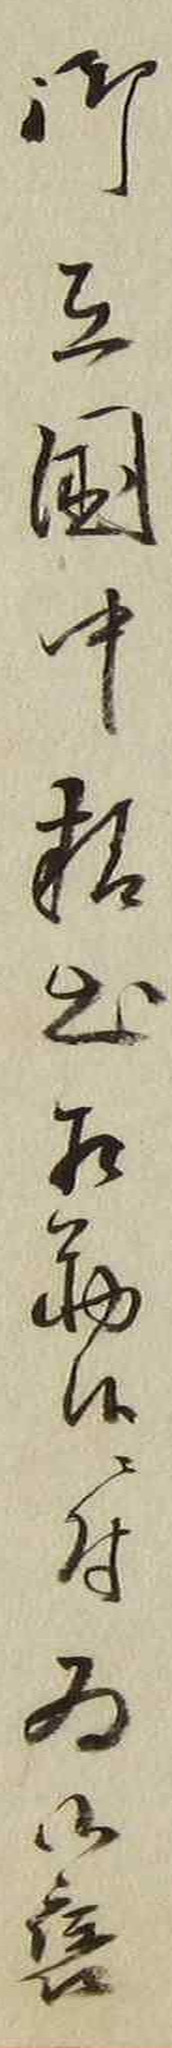御在国中精出相勤候ニ付為御褒
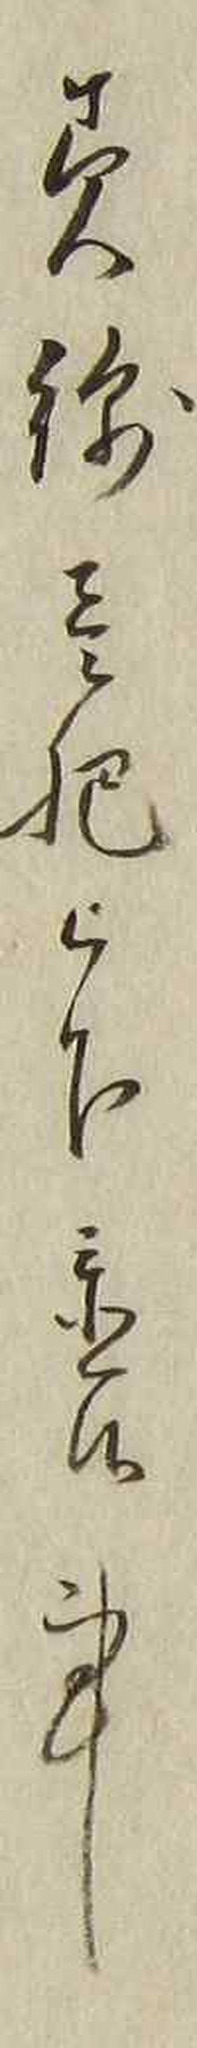美綿壱把被下置候事
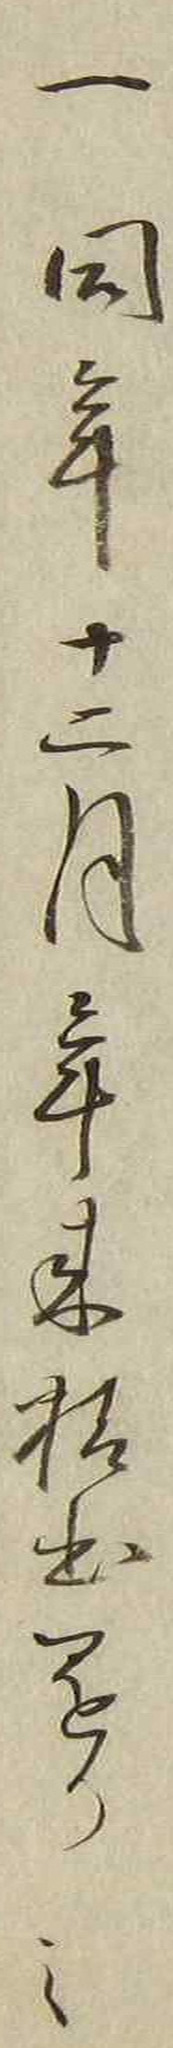一同年十二月年来精出懸り之

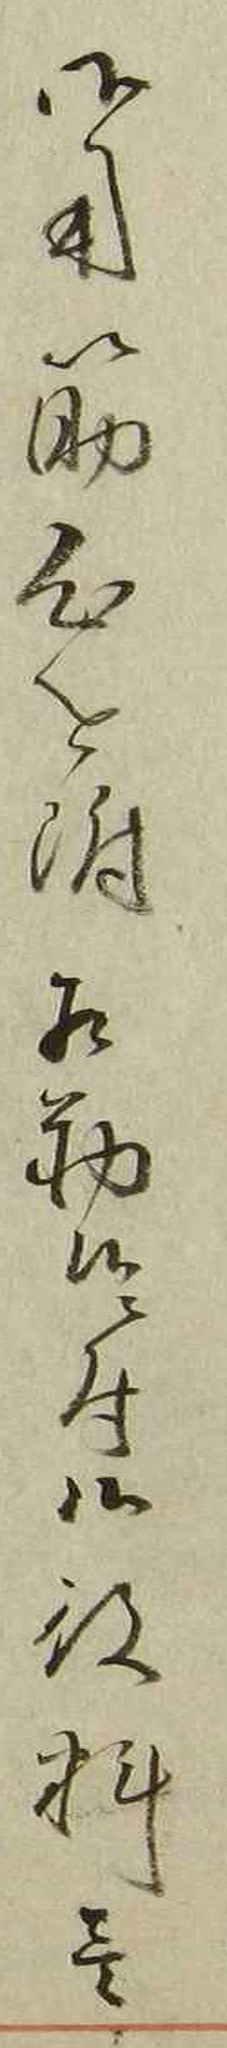御用筋心を附相勤候ニ付御役料壱
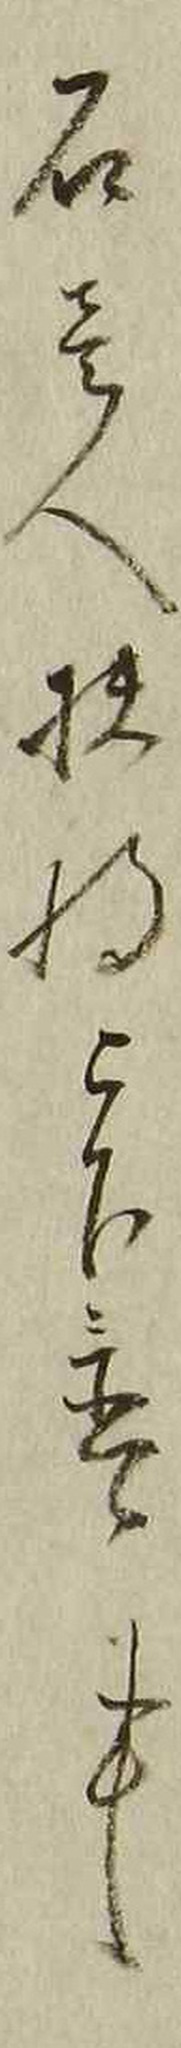石壱人扶持被下置候事
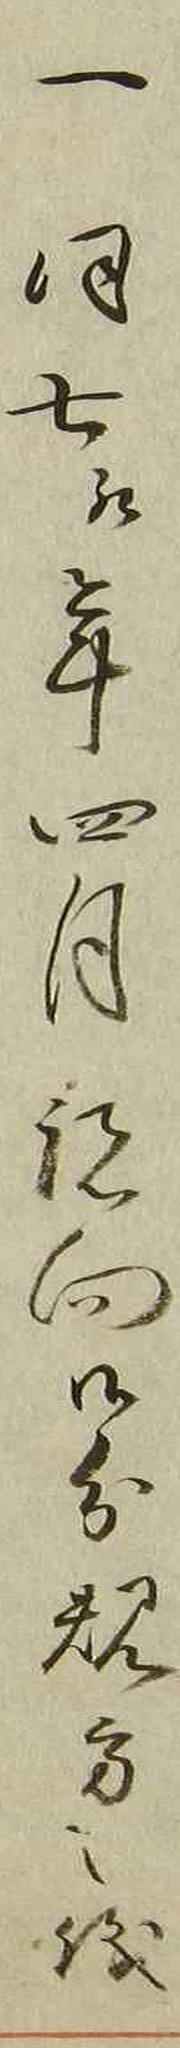一同七卯年四月諸向候分規方之儀
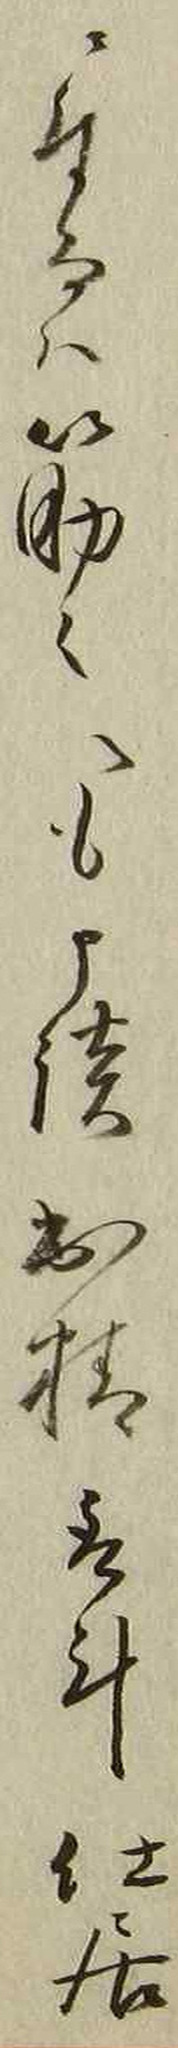ニ付而は筋々へも申談出精取計仕居
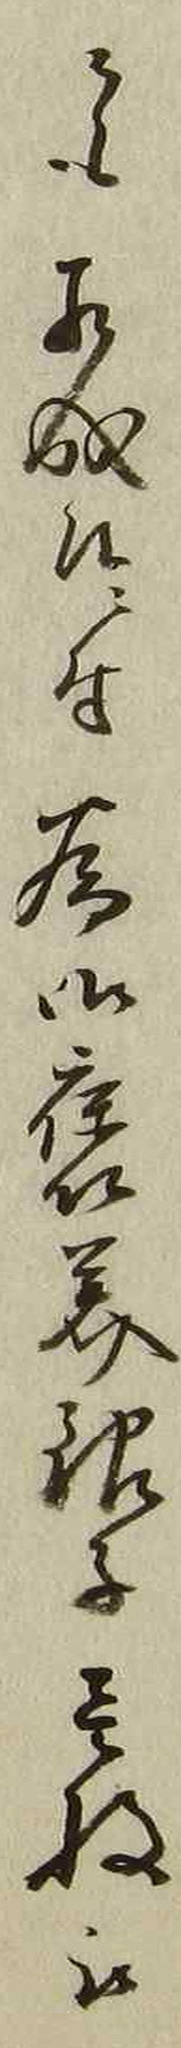ニも相成候ニ付為御褒美銀子壱枚被
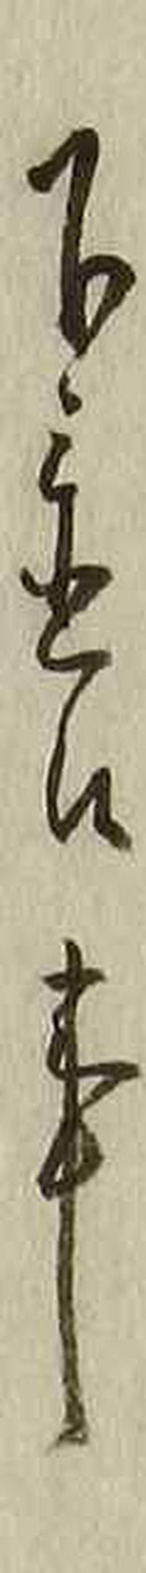下置候事
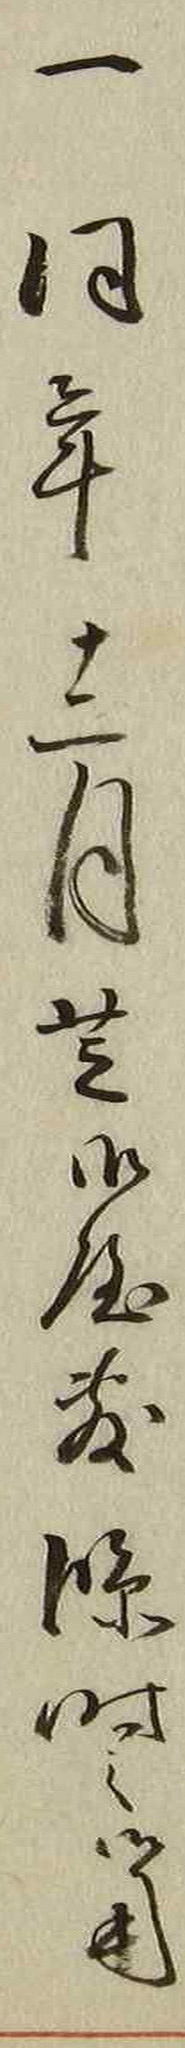一同年十二月芝御屋敷臨時之御用
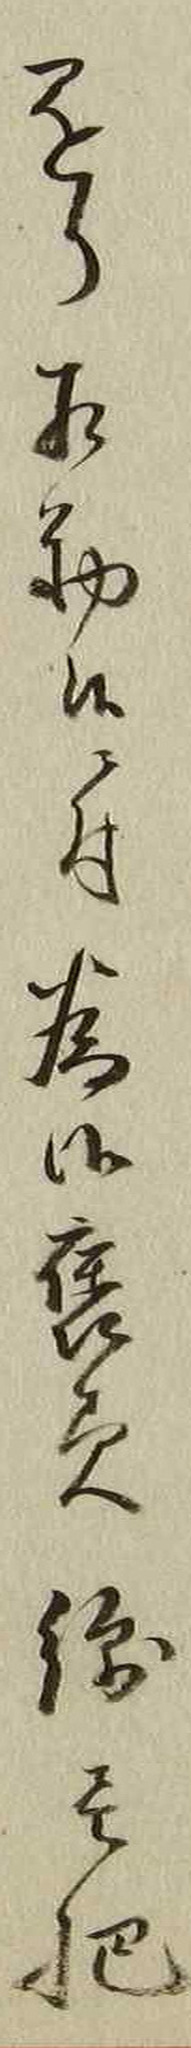懸り相勤候ニ付為御褒美綿壱把
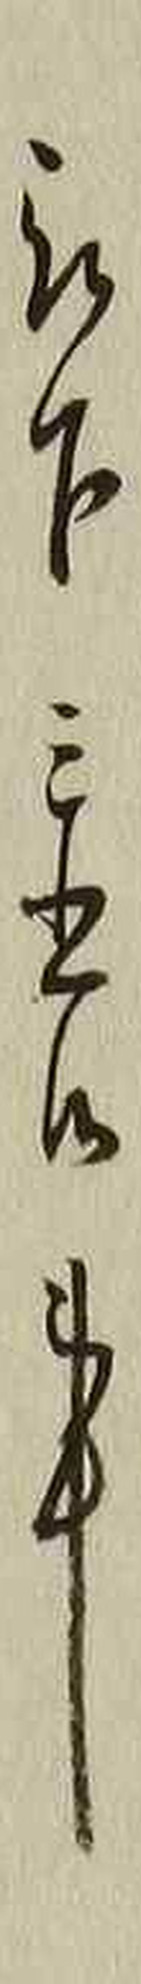被下置候事
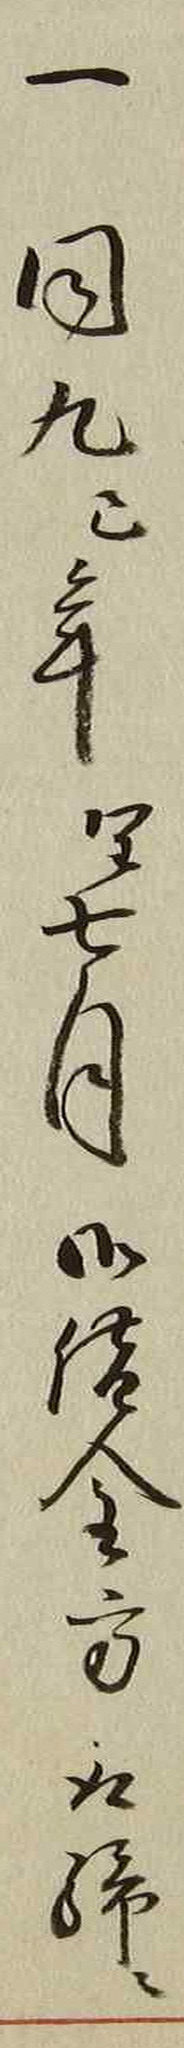一同九巳年閏七月御借金方取締ニ
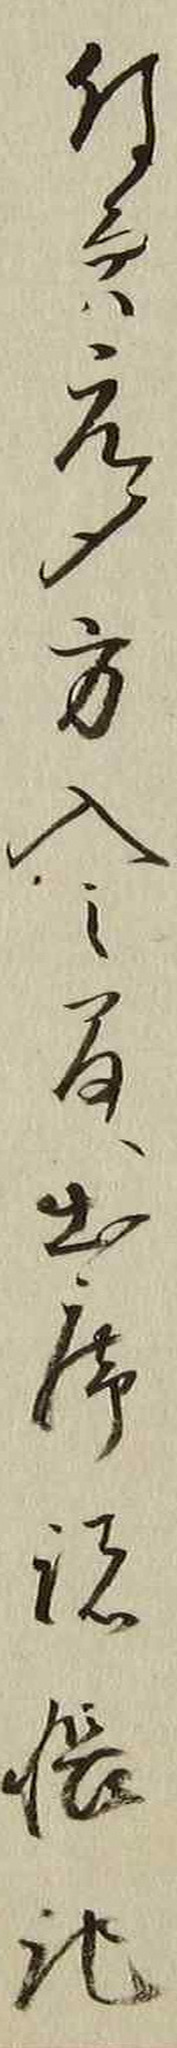付而は元〆方入之間へ出席諸帳記
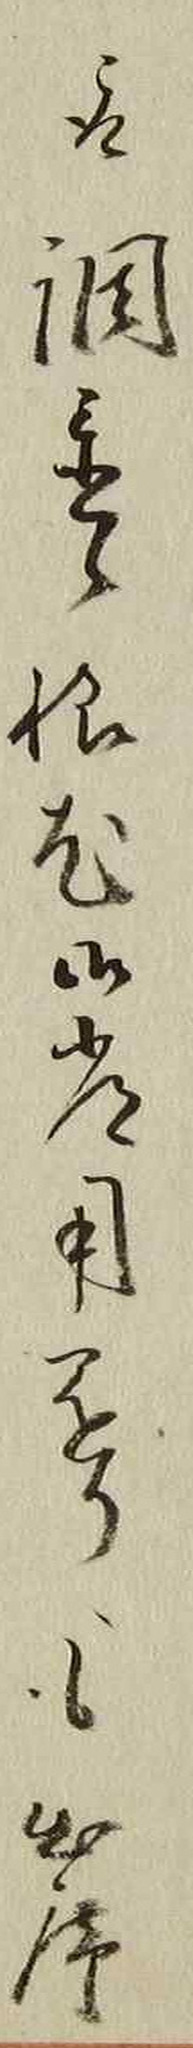取調置候様尤御常用懸りへも出席
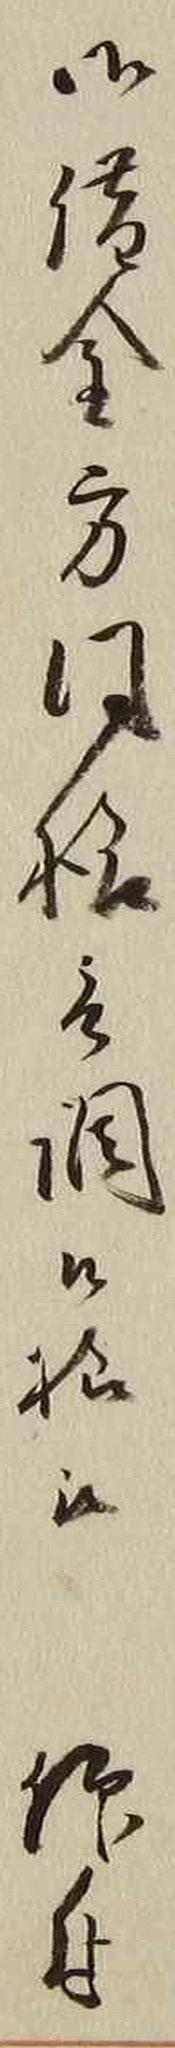御借金方同様取調候様被仰付
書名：諸士系譜　巻之32　い之部32
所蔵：会津若松市立会津図書館
